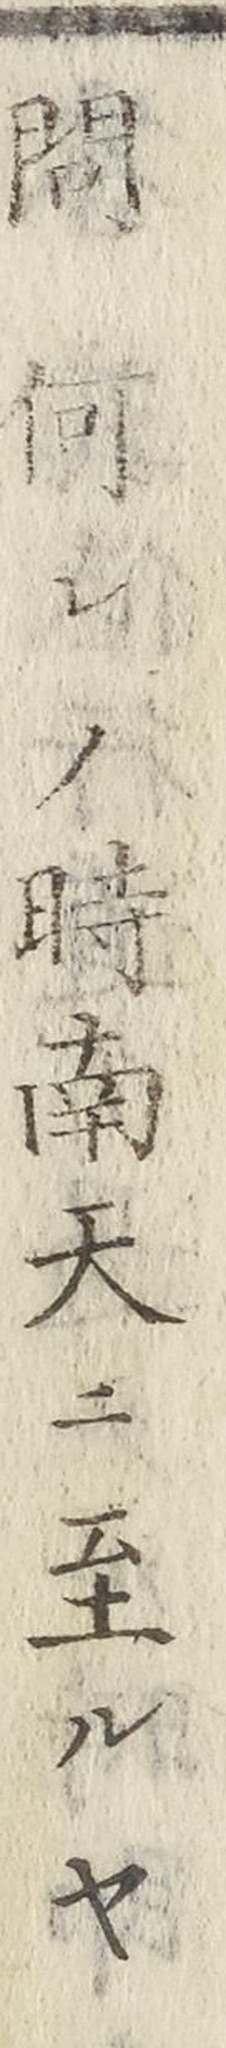問何レノ時南天ニ至ルヤ

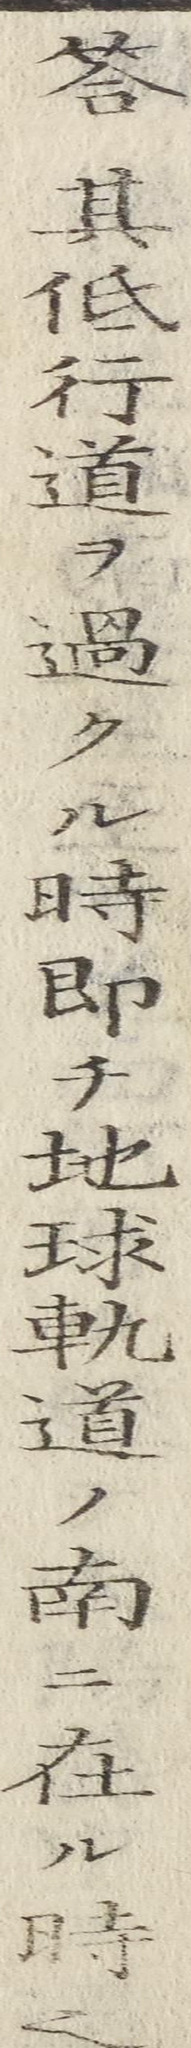答其低行道ヲ過クル時即チ地球軌道ノ南ニ在ル時也
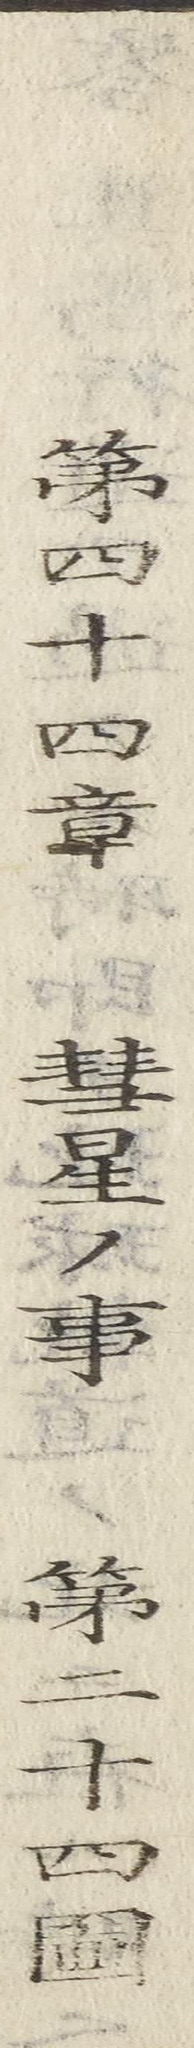第四十四章彗星ノ事第二十四図
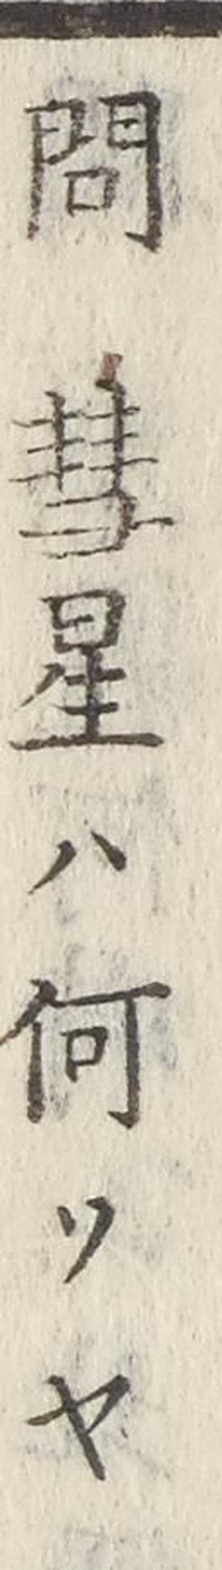問彗星トハ何ソヤ
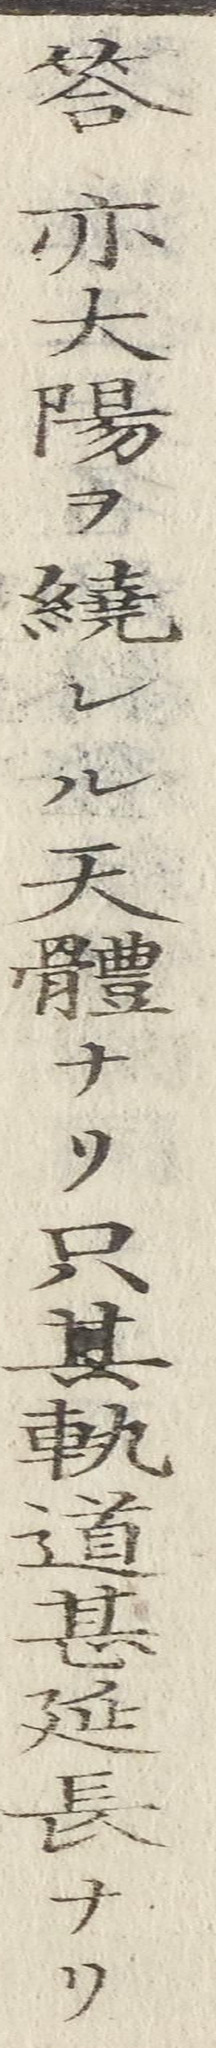答亦大陽ヲ繞レル天体ナリ只其軌道甚延長ナリ
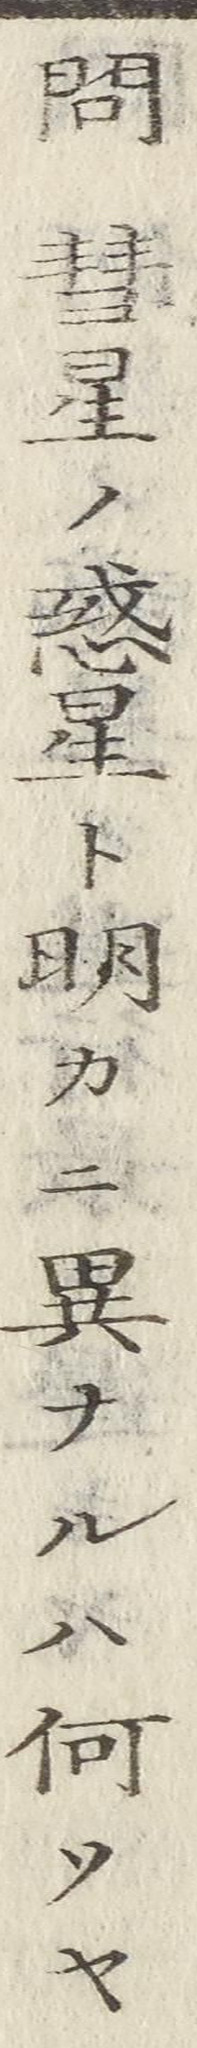問彗星ノ惑星ト明カニ異ナルハ何ソヤ
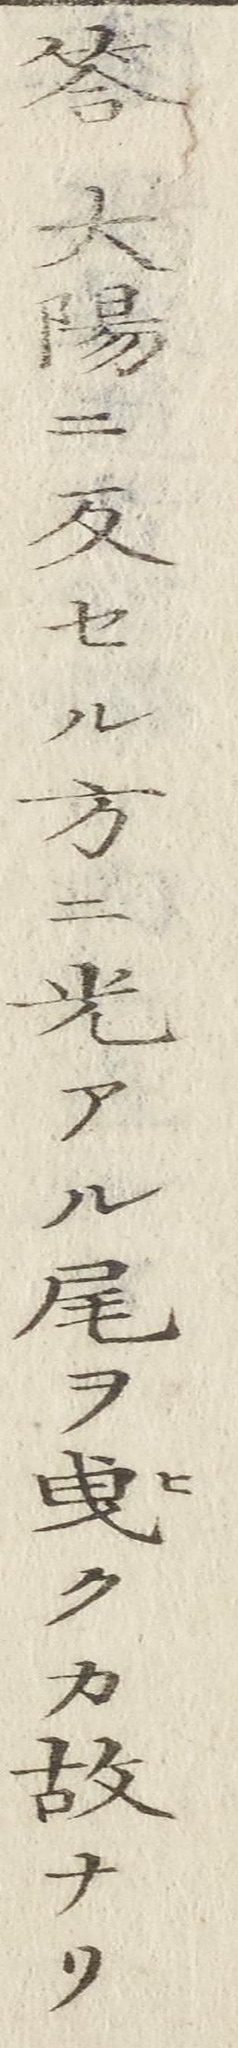答大陽ニ反セル方ニ光アル尾ヲ曳クカ故ナリ
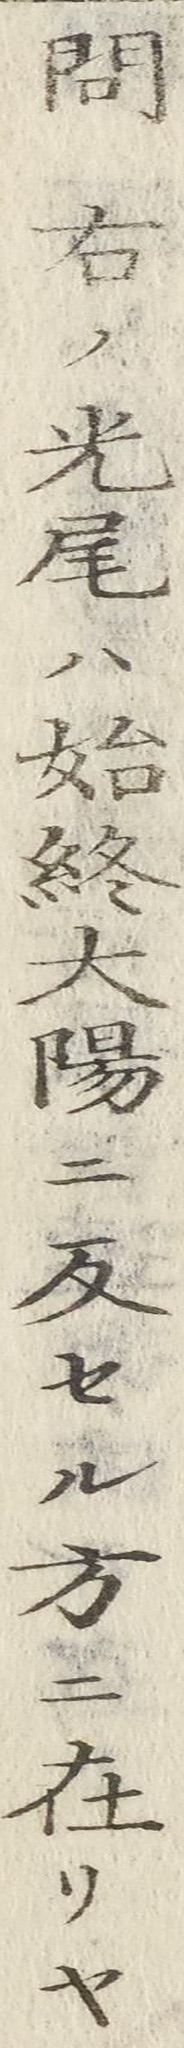問右ノ光尾ハ始終大陽ニ反セル方ニ在リヤ
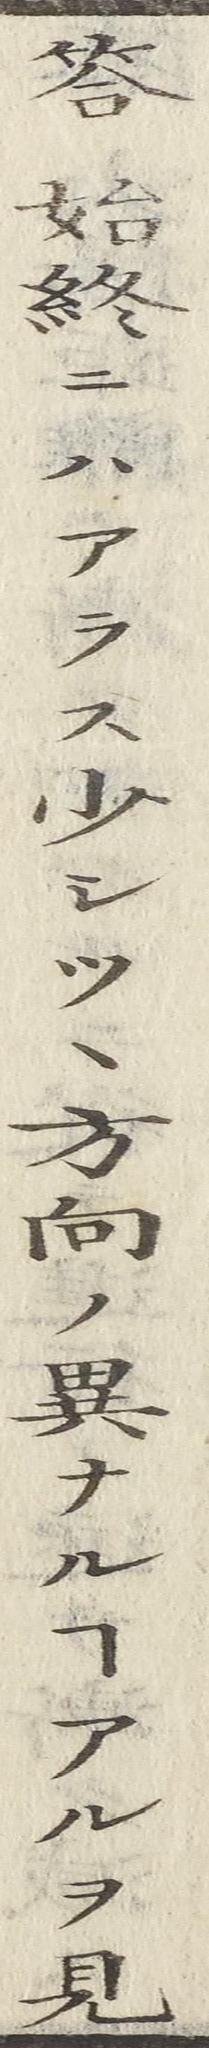答始終ニハアラス少シツヽ方向ノ異ナルコトアルヲ見
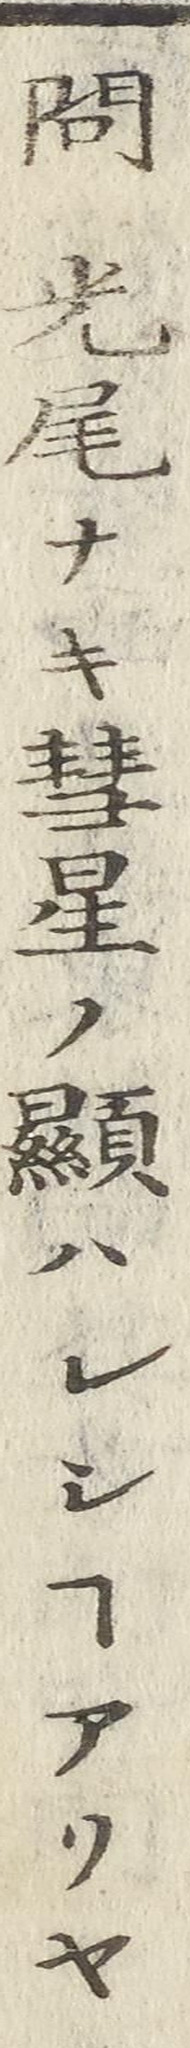問光尾ナキ彗星ノ顕ハレシコトアリヤ
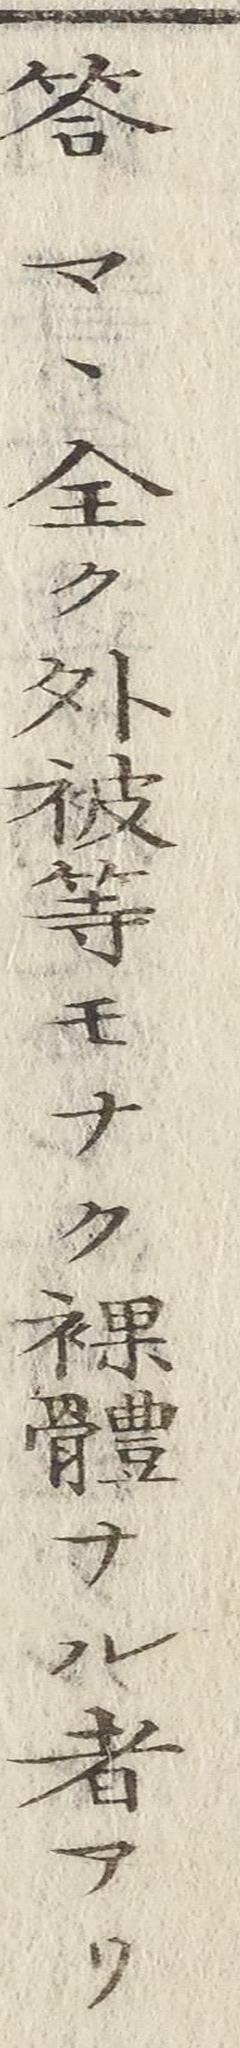答マヽ全ク外被等モナク裸体ナル者アリ
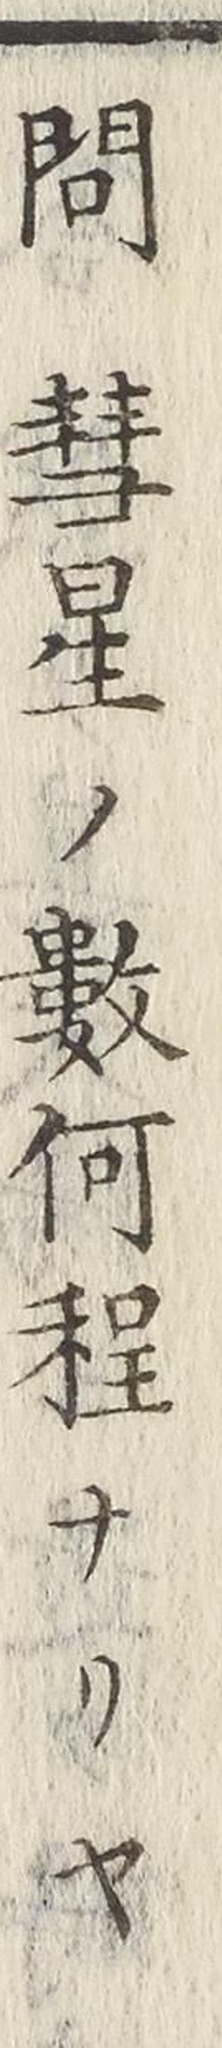問彗星ノ数何程ナリヤ
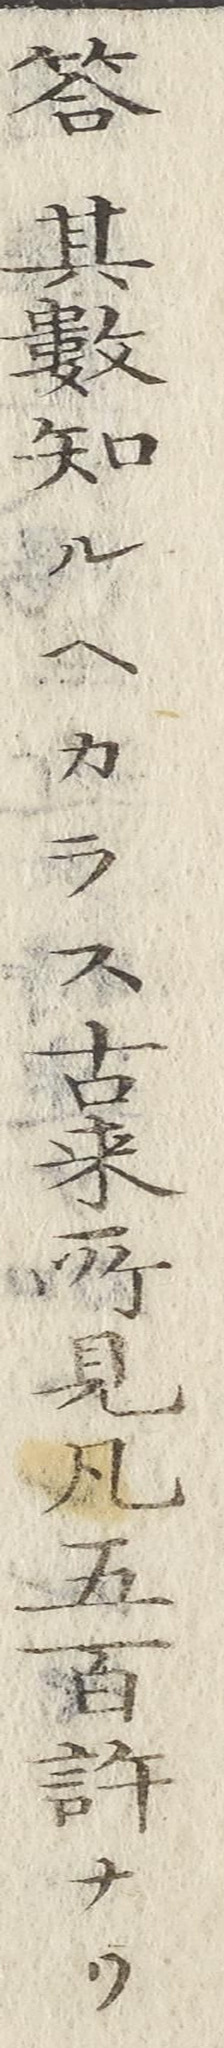答其数知ルヘカラス古来所見凡五百許ナリ
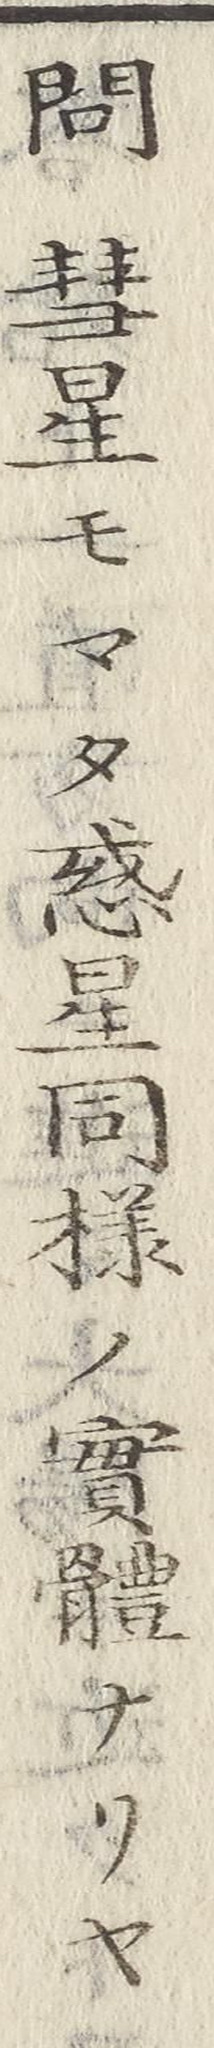問彗星モマタ惑星同様ノ実体ナリヤ
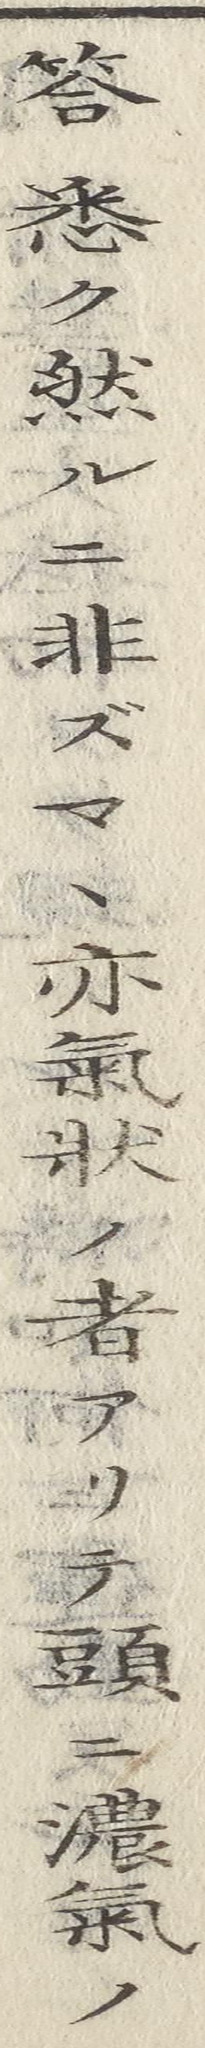答悉ク然ルニ非ズマヽ亦気状ノ者アリテ頭ニ濃気ノ
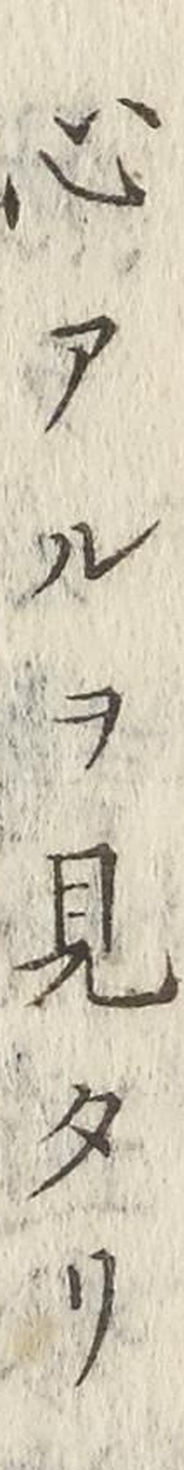心アルヲ見タリ
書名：星学圖説　下
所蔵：東京大学地震研究所図書室 Earthquake Research Institute Library, The University of Tokyo, JAPAN
